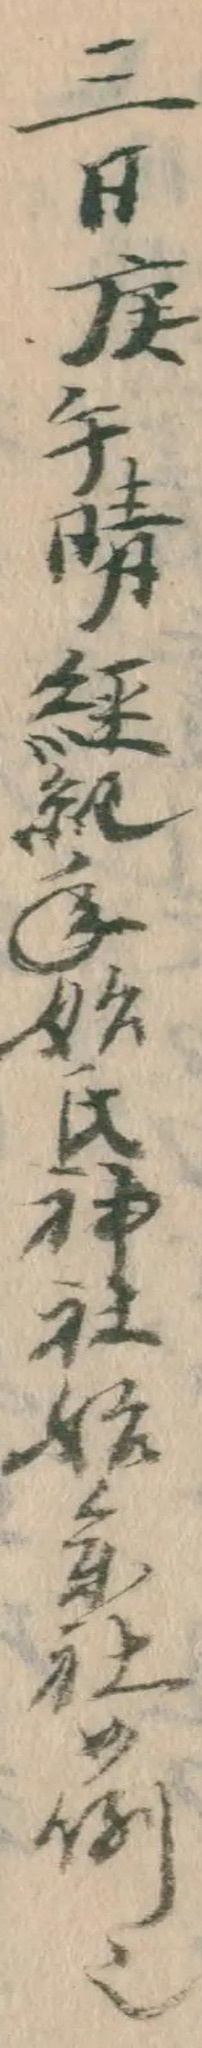三日庚午晴経紀年始氏神社始参社如例也
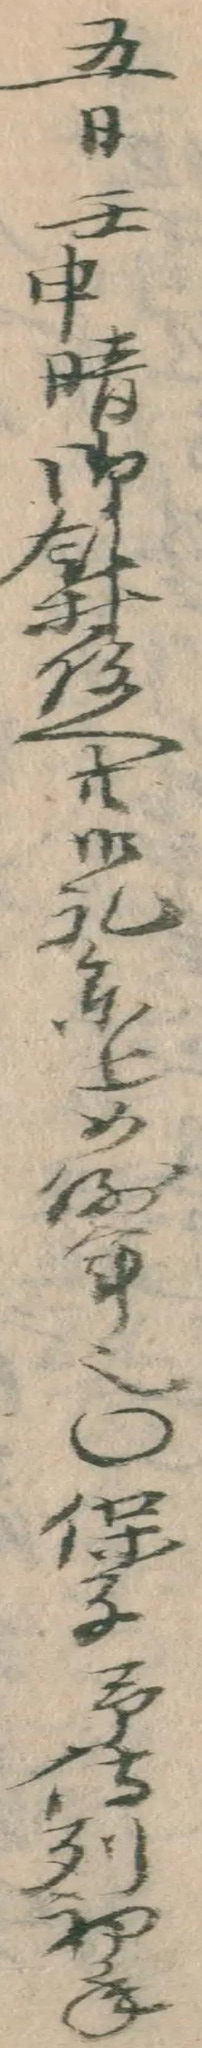五日壬申晴御領村役人共御礼参上如例年也○保子予侍列初年
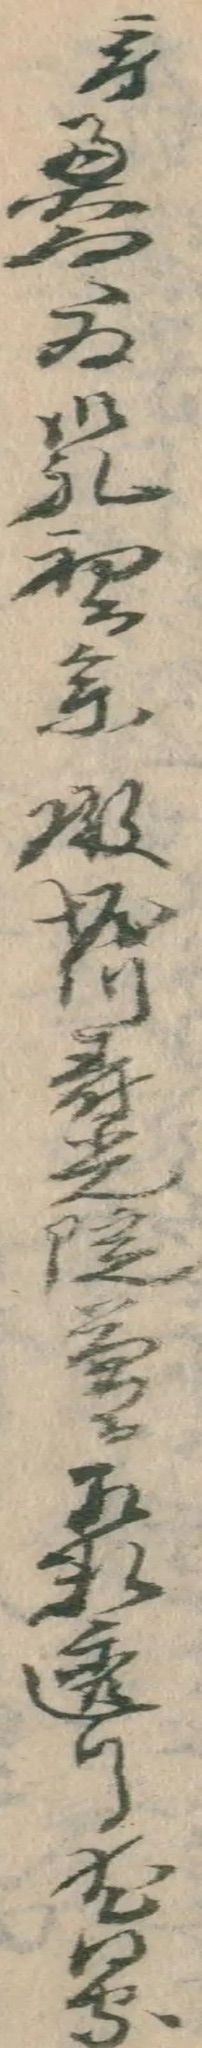ニ付奥向きヘ為御礼初而参殿堀川壽光院兼而相頼透引尤同家
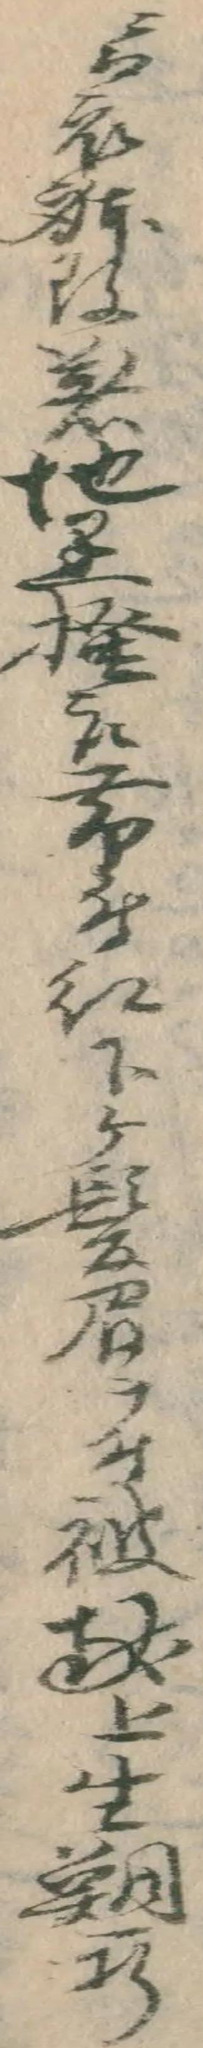ニ而衣躰改着地黒掻取帯付被下ケ髪眉ヲ付被献上生鯛新
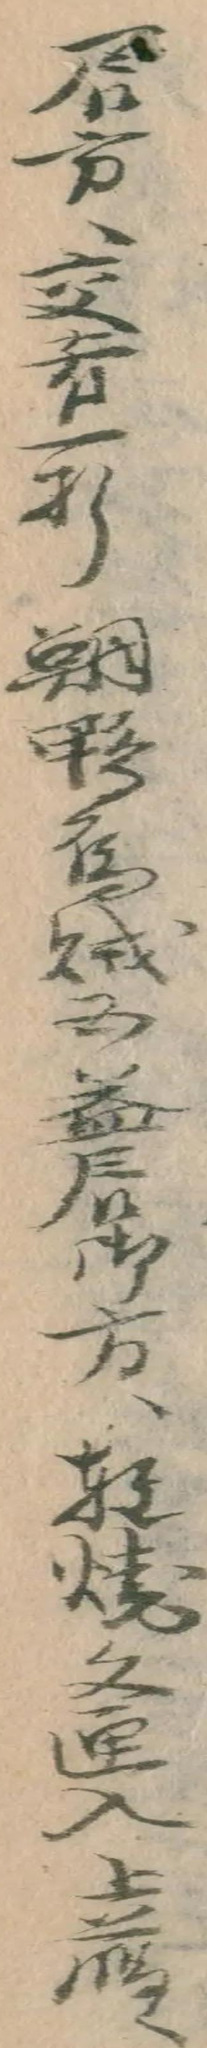君方へ交有一折鯛鴨烏賊五益君方へ鮭焼文匣入上臈へ

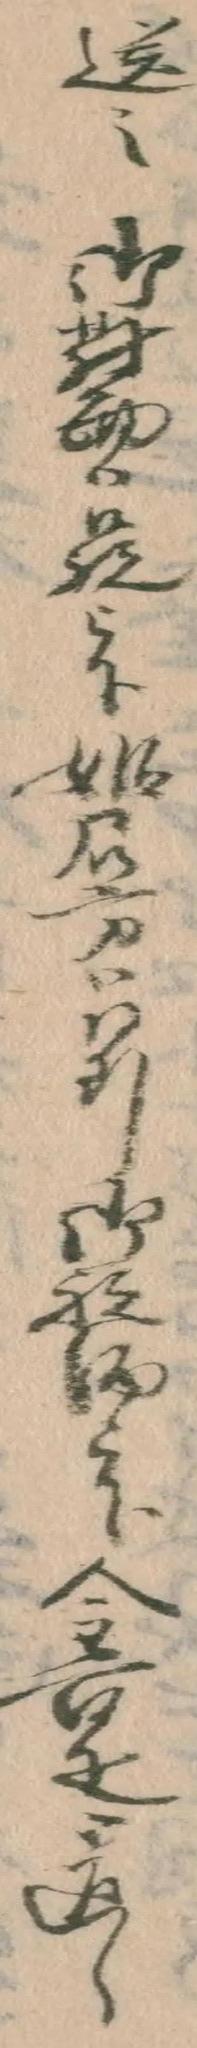送之御對面御祝被下姫君方御同断御祝酒被下金百疋被返し
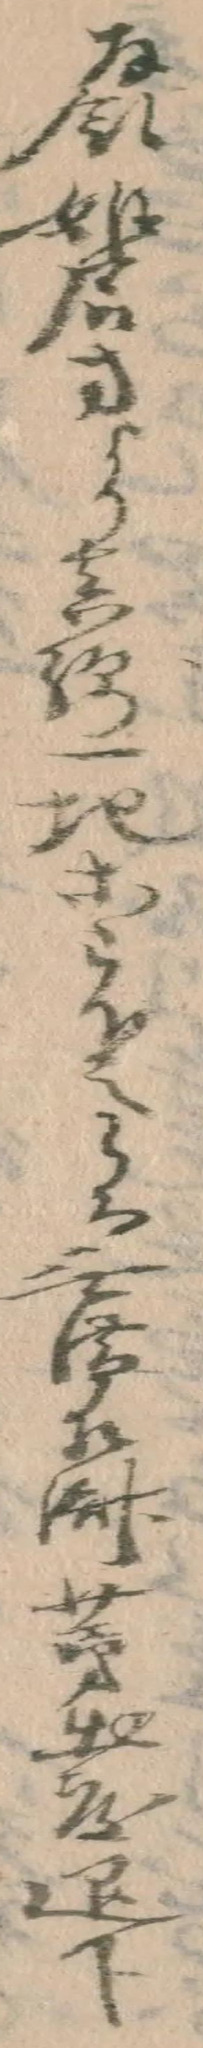拝領姫君方より真綿一把等被下之了而無滞相済芽出度退下
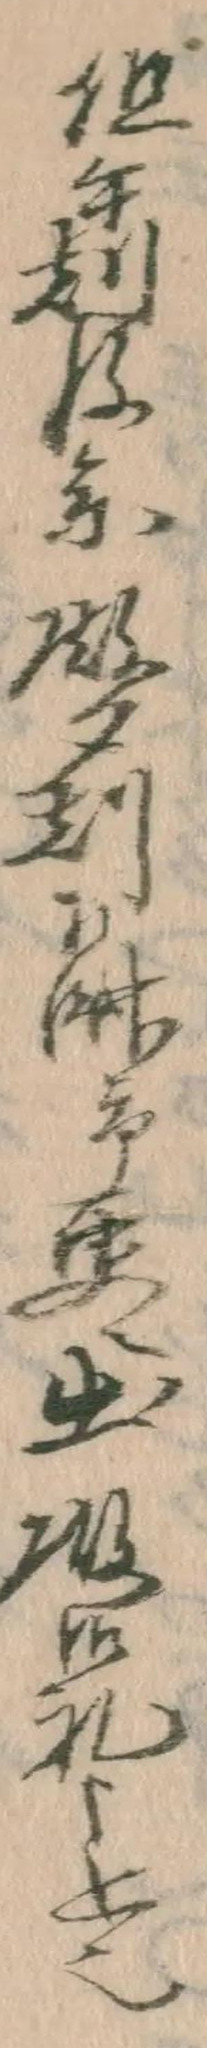但午刻後参殿夕刻相済予更へ出殿御礼申上也
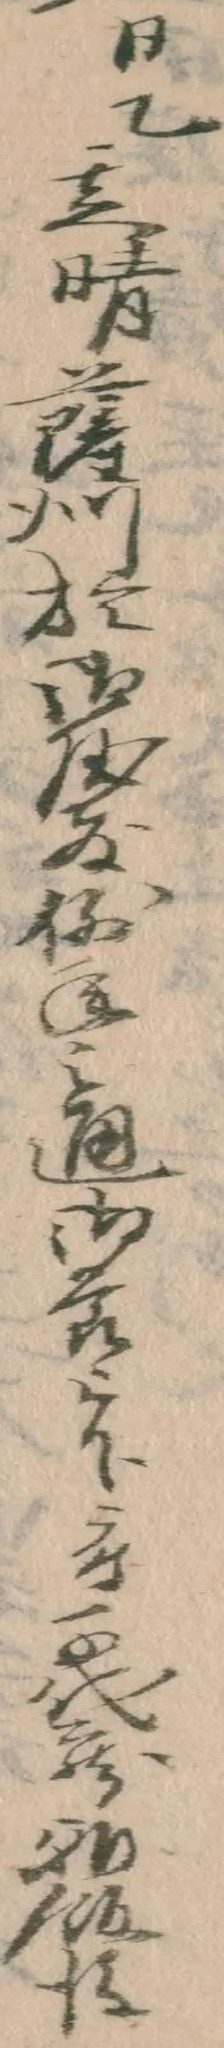八日乙亥晴薩州於御屋敷例年之通御節被下ニ付千代蔵朝飯後
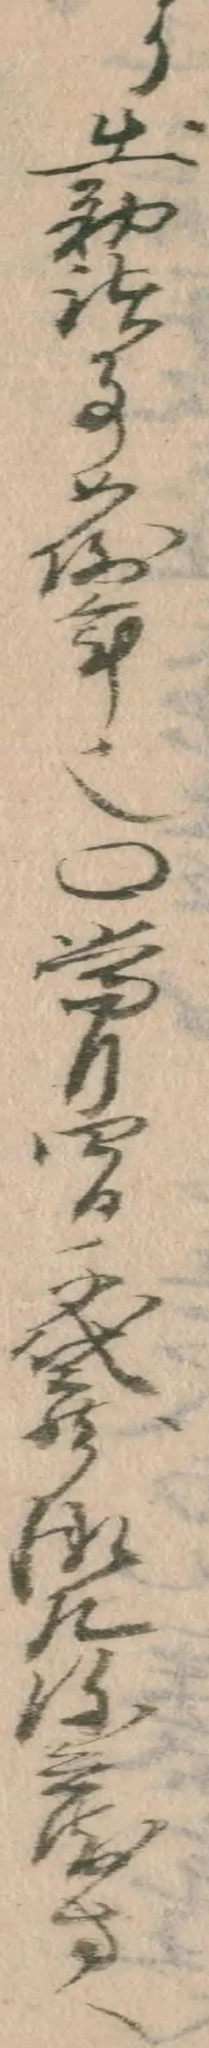より出勤諸事如例年也〇當月四日手代蔵瀬尾弥兵衛方へ
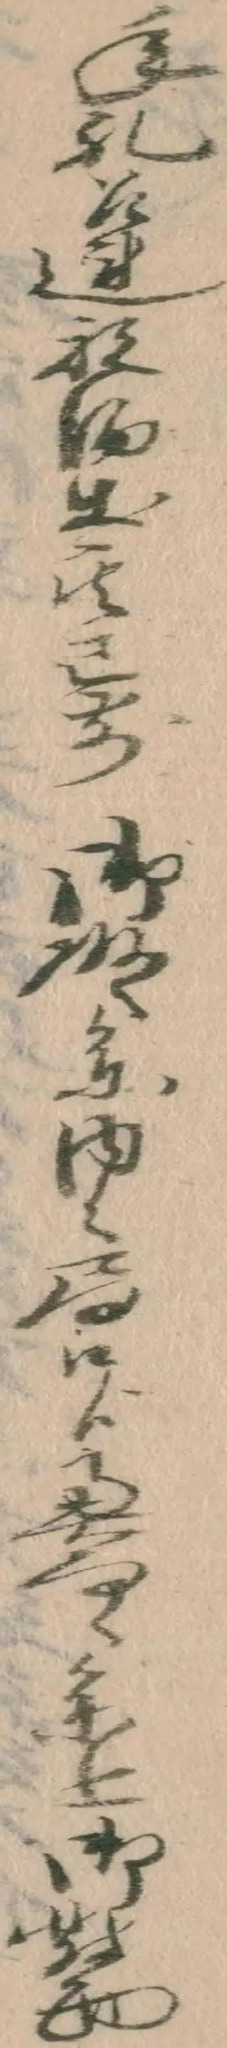年礼召連祝酒出其已前御殿参内之局口ゟ奥向へ参上御對面
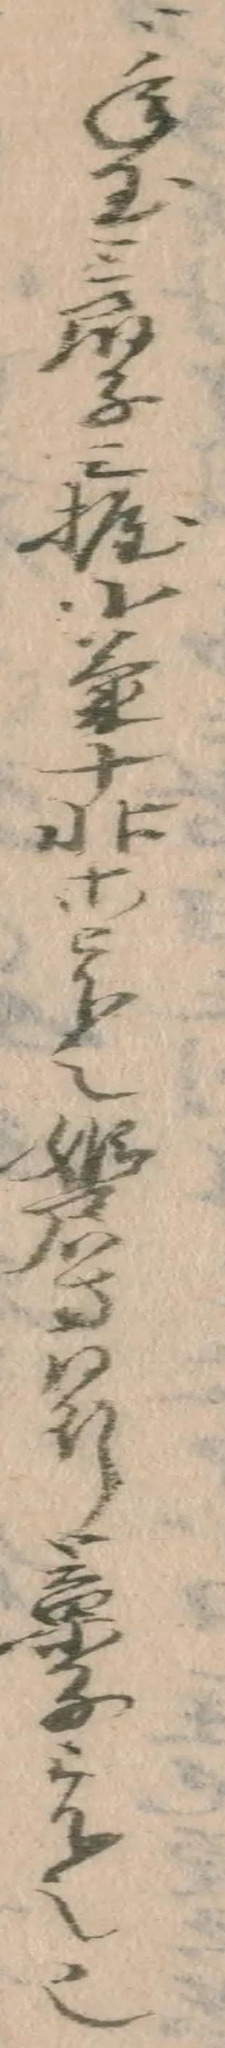御年玉御扇子三握小菊十非等被下也姫君方同断御菓子被下之也
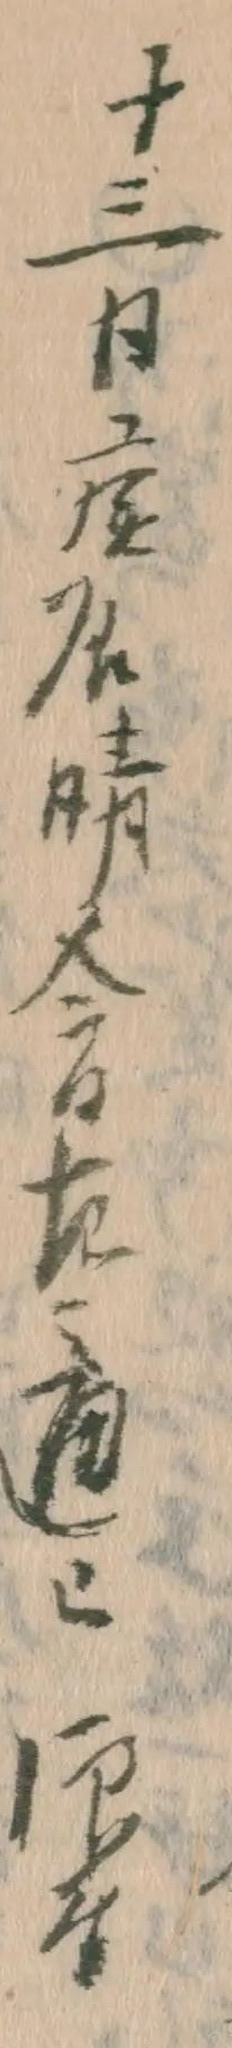十三日庚辰晴今日左之通被仰付
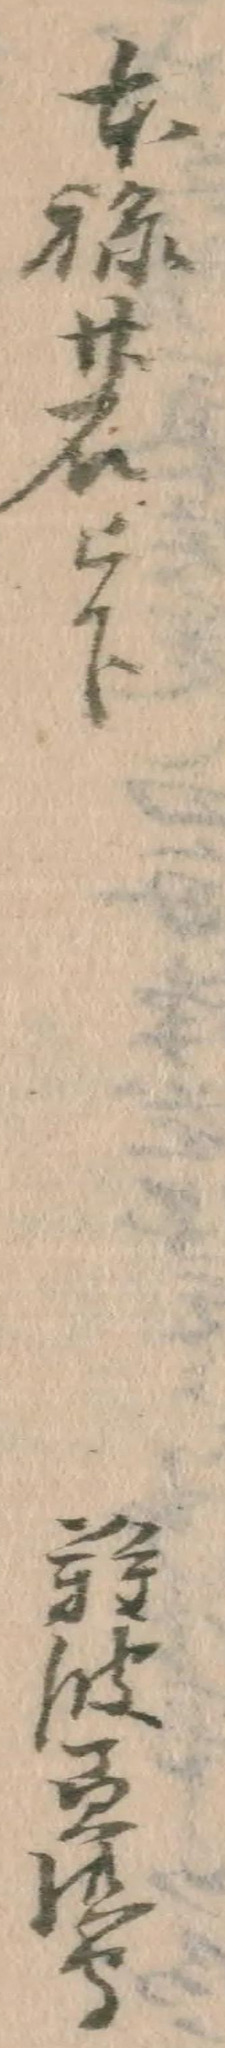本禄廿石被下難波美濃守
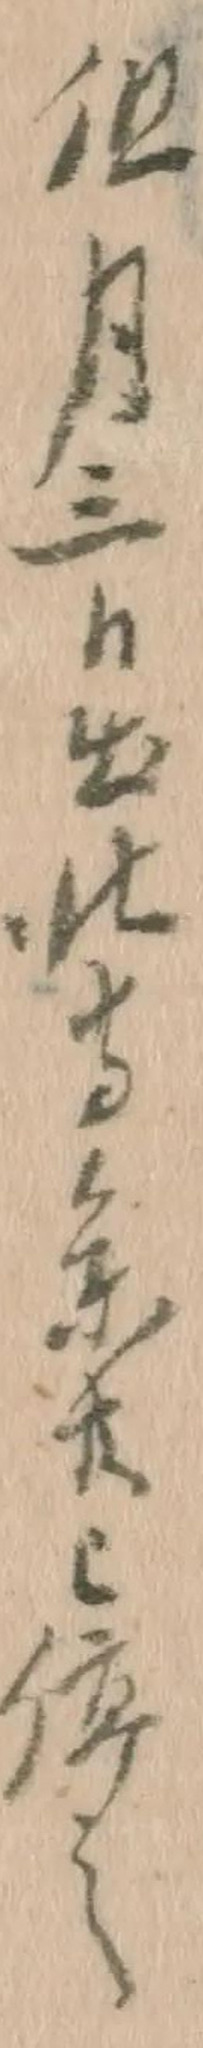但月三日出仕寺参共被停也
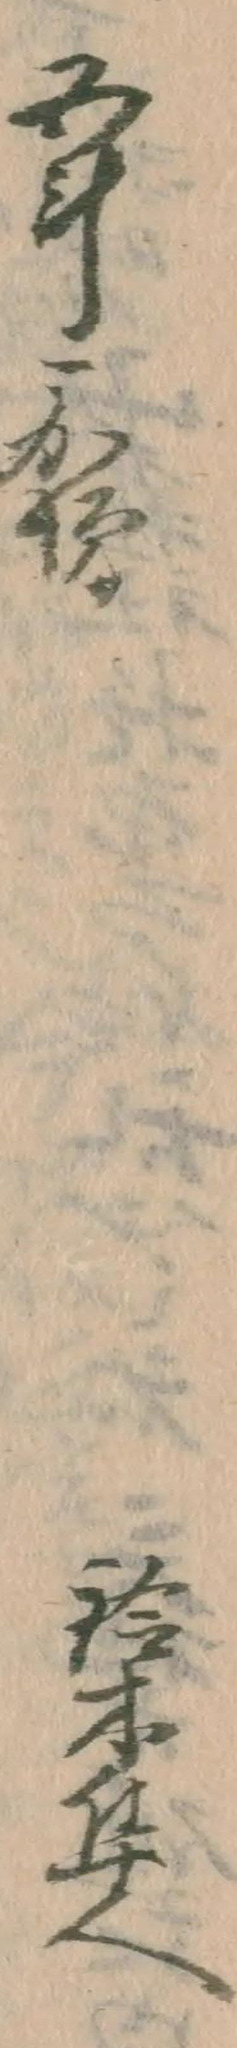五斗御加増鈴木隼人
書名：賀茂社記録. 第69冊
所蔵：国立国会図書館 National Diet Library, JAPAN
